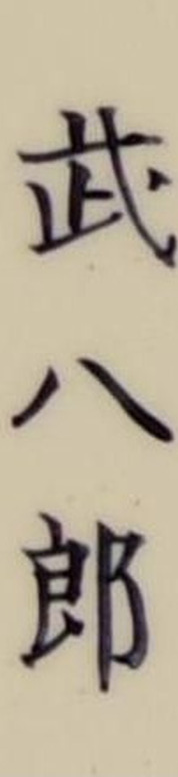武八郎
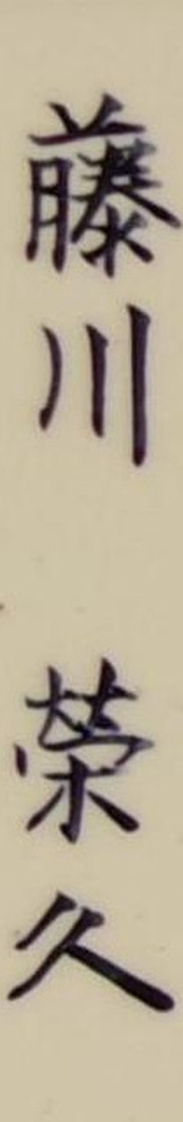藤川榮久

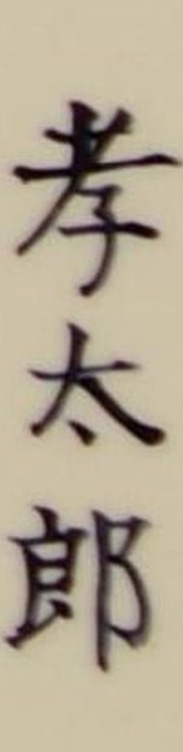孝太郎
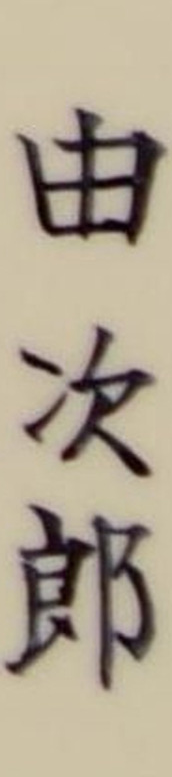由次郎
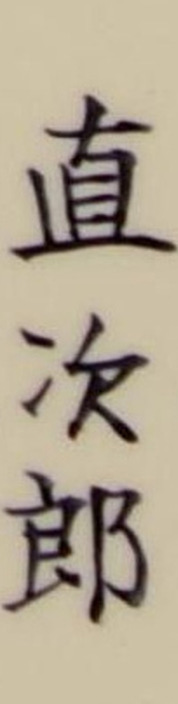由次郎
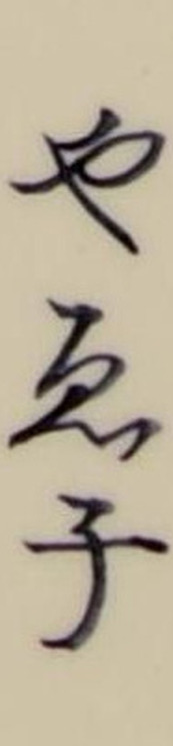やゑ子
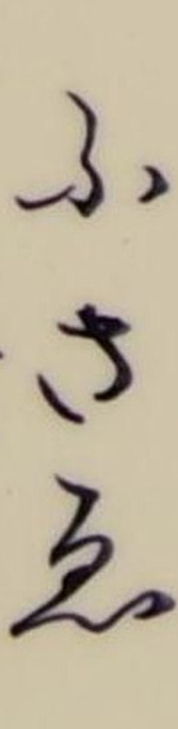ふさゑ
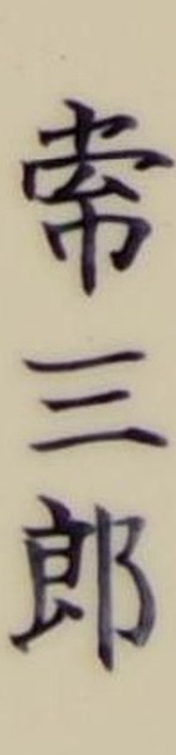常三郎
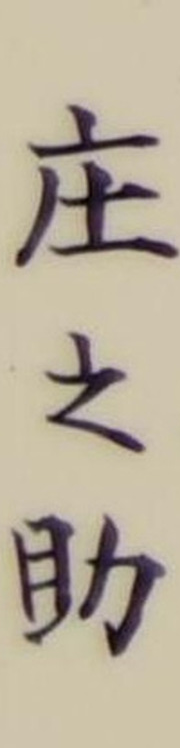庄之助

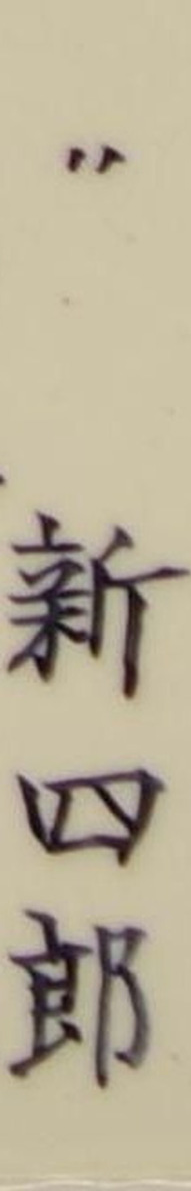新四郎
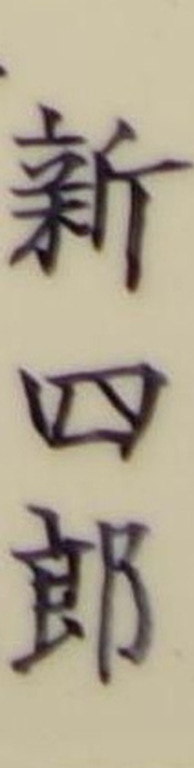新四郎
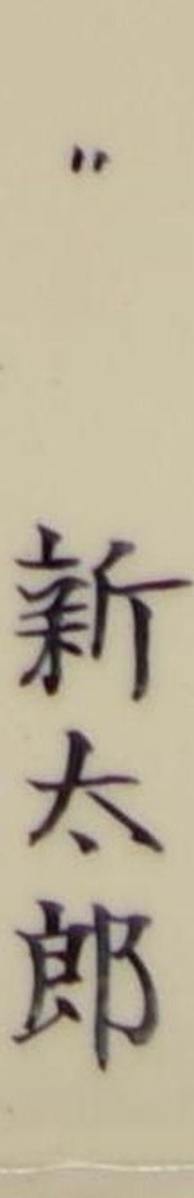新太郎
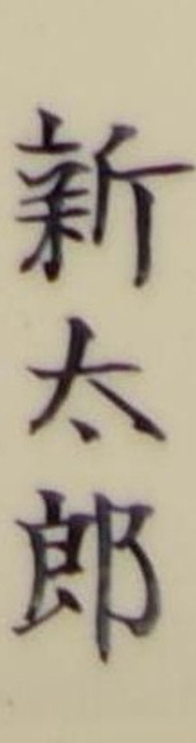新太郎
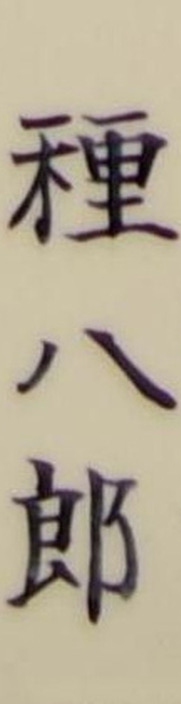種八郎
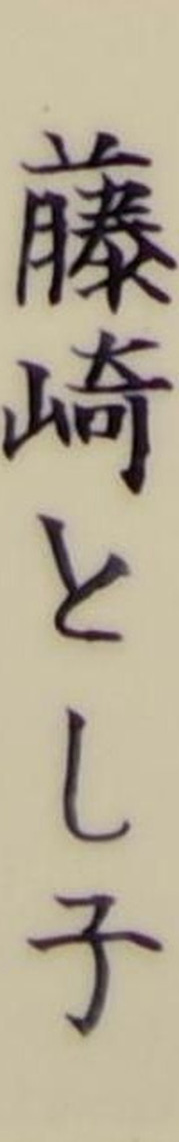藤崎とし子
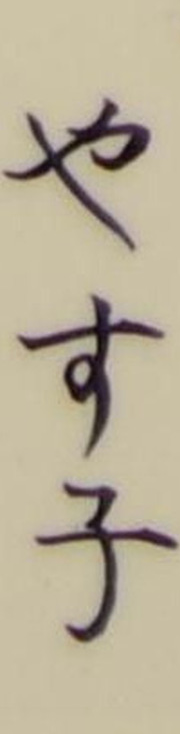やす子
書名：E~L
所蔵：高野山金剛峯寺
